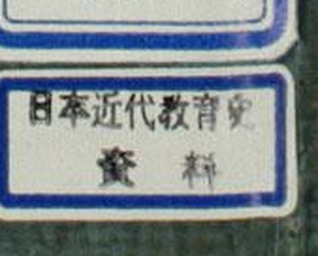日本近代教育史
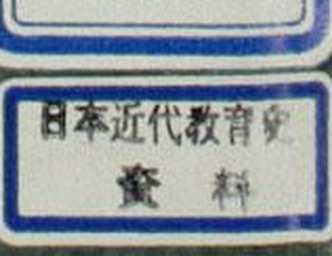日本近代教育史
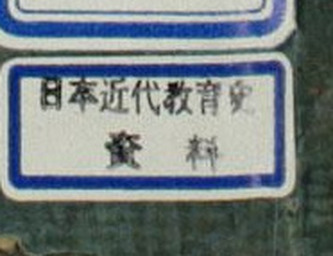日本近代教育史

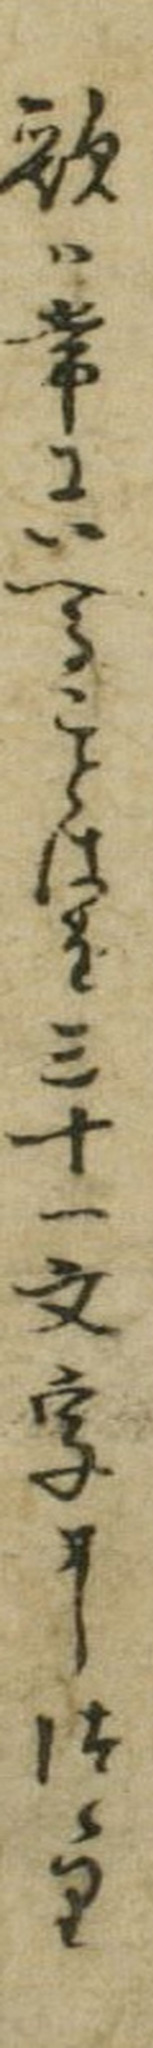歌は常にいへることはを三十一文字につゝり
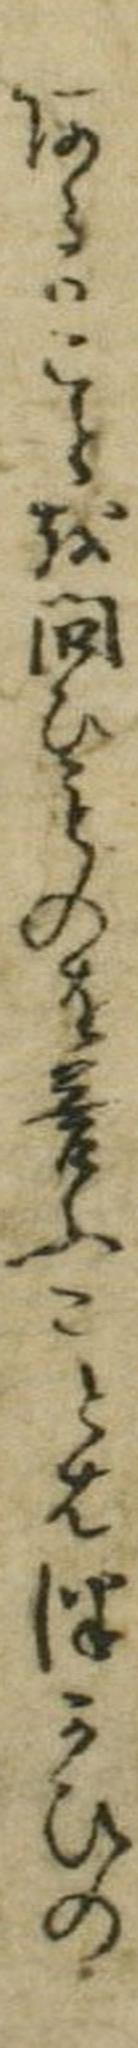あるはことを問ひものを答ふことはつかひの
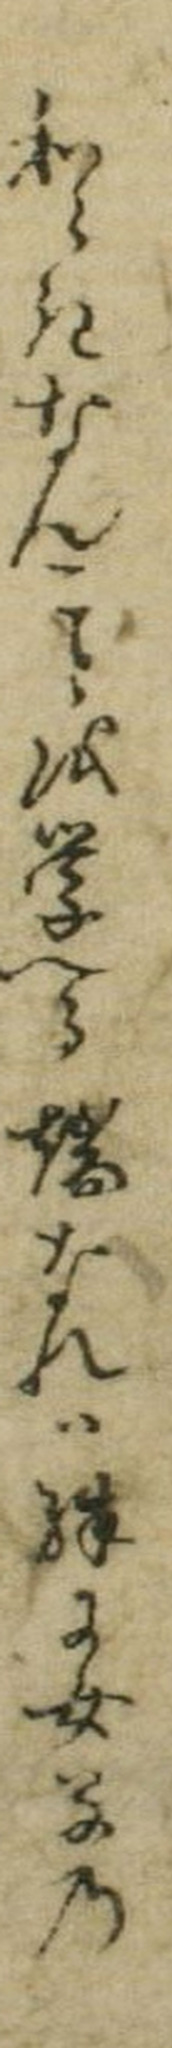わゝきなんことを学へる端なれは殊に女子の
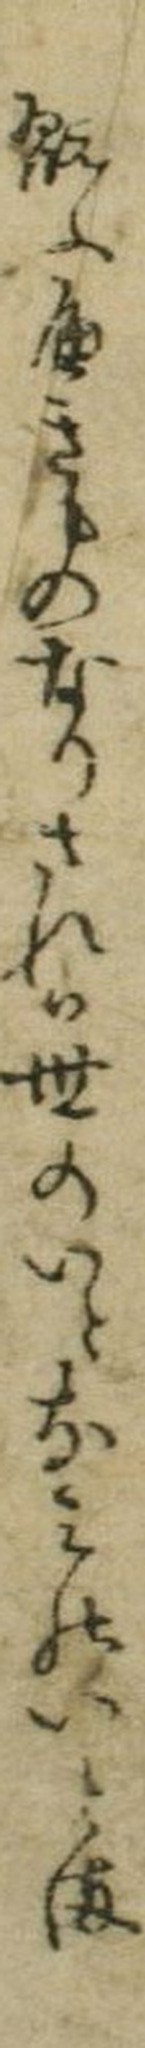翫ふへきものなりされは世のいとなみのいとま
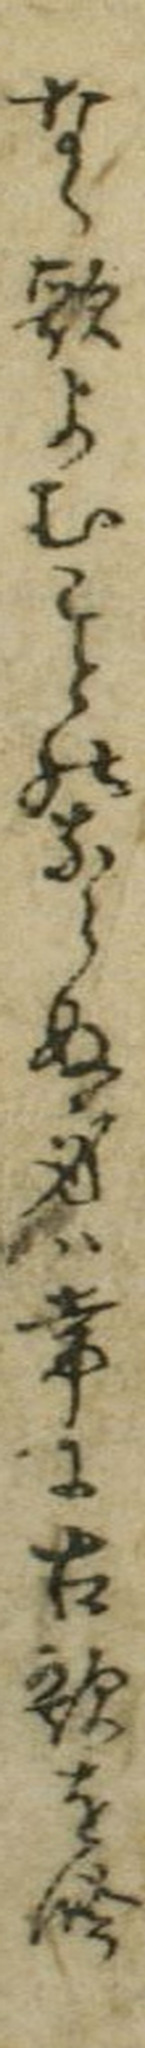なく歌よむことのならぬ身は常に古歌を吟
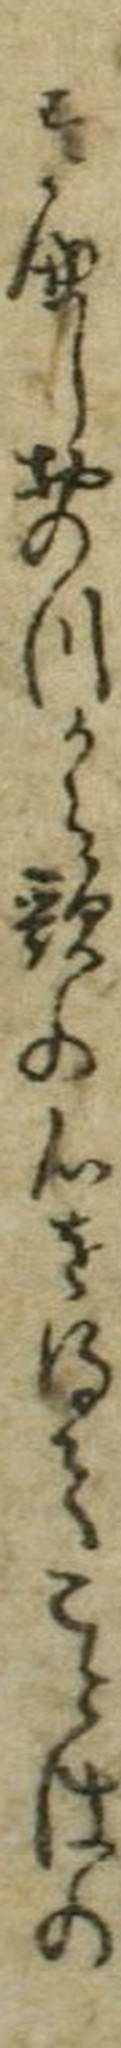すへしおのつから歌の心を得てことはの
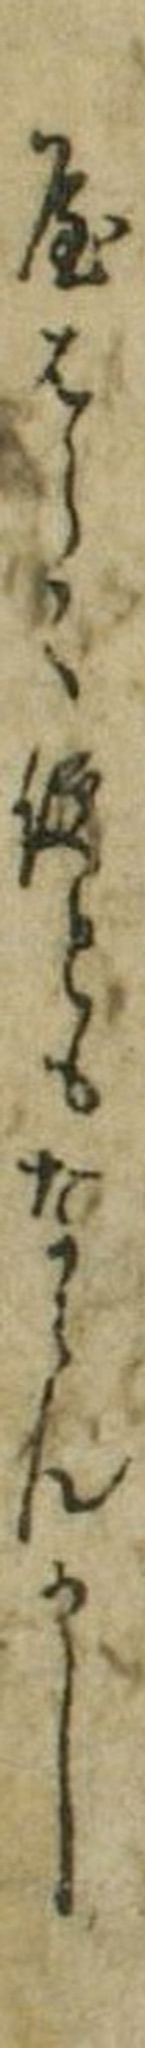やはらく便ともならんかし

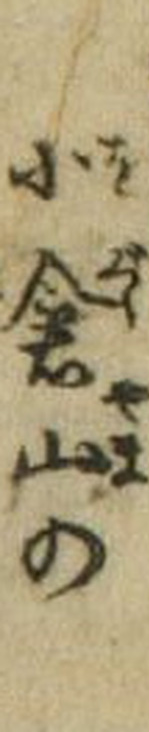小倉山の
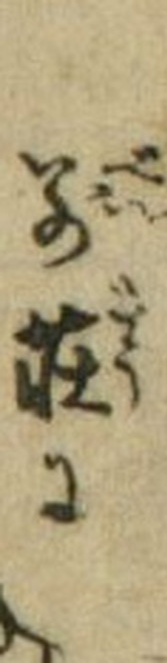別荘に
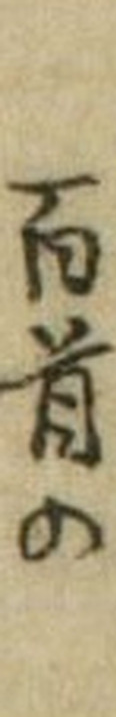百首の
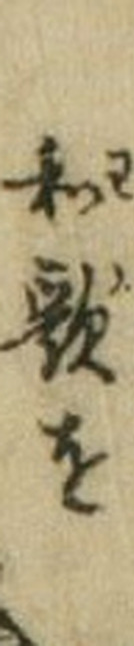和歌を
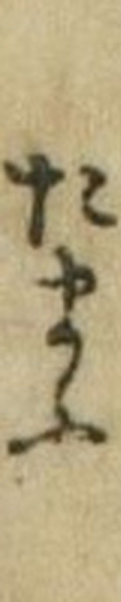たまふ

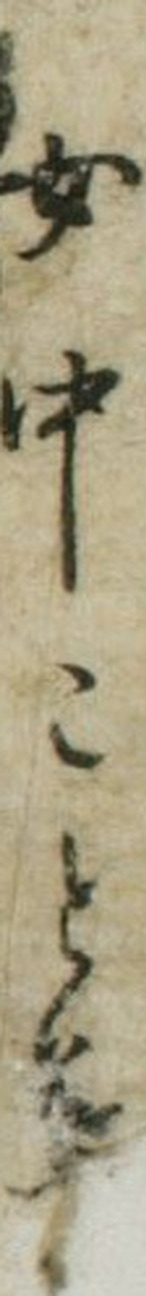女中こと葉
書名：百人一首
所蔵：東京学芸大学教育コンテンツアーカイブ
